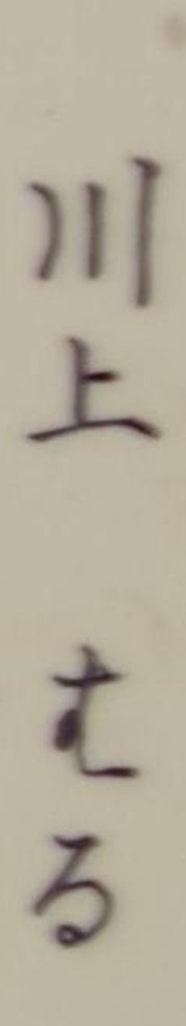川上はる
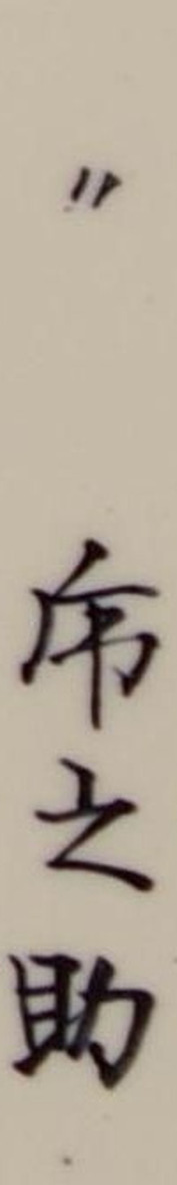市之助
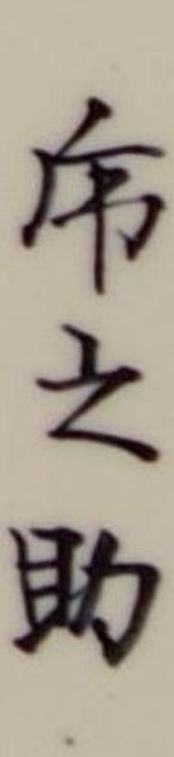市之助
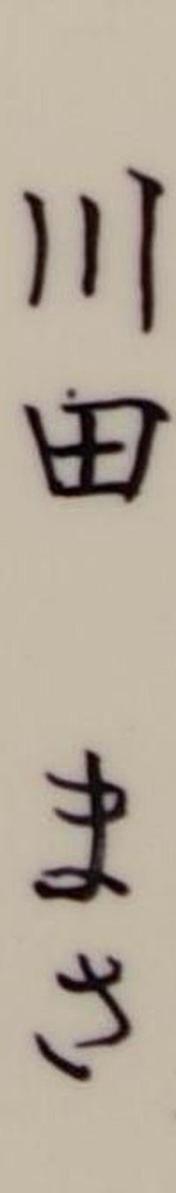川田まさ
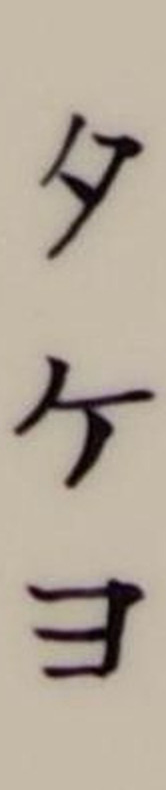タケヨ
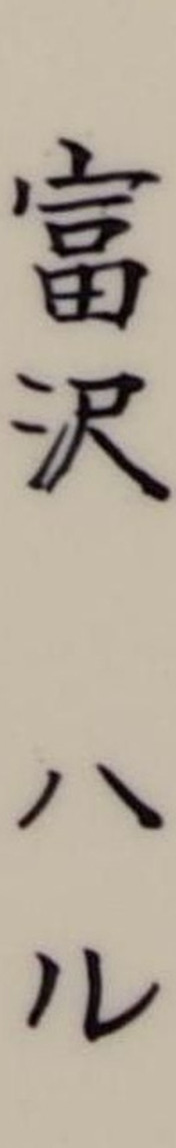富沢ハル
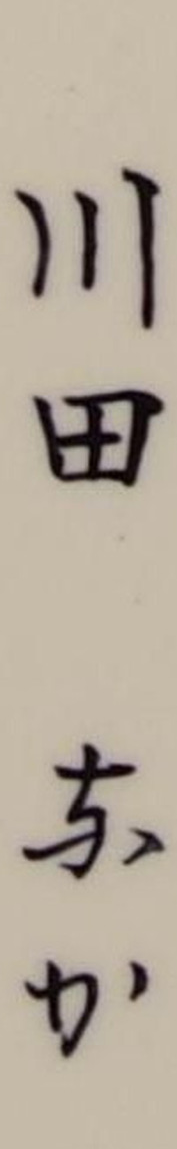川田なか
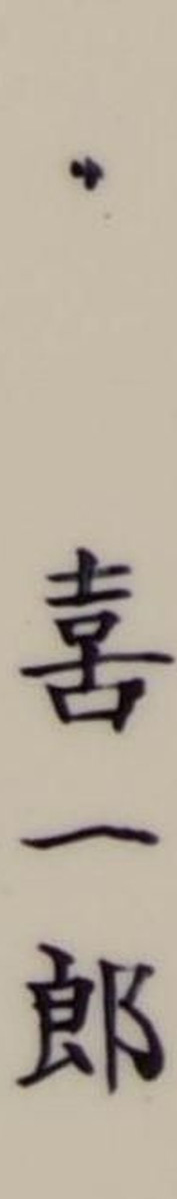喜一郎
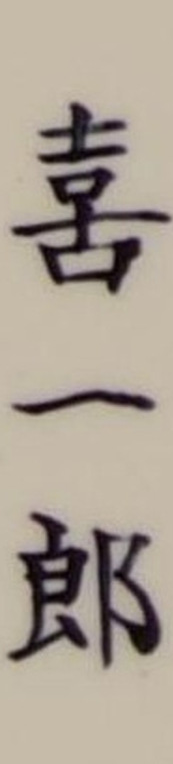喜一郎

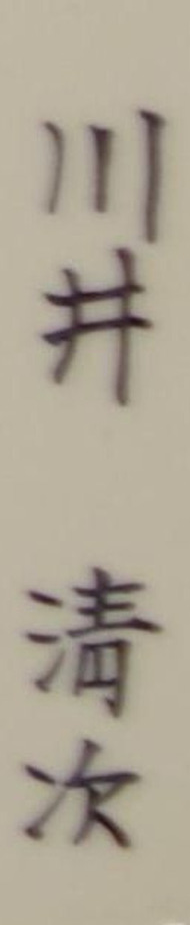川井清次
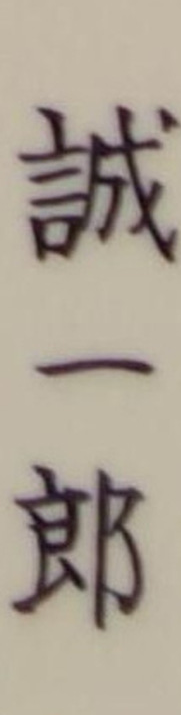誠一郎
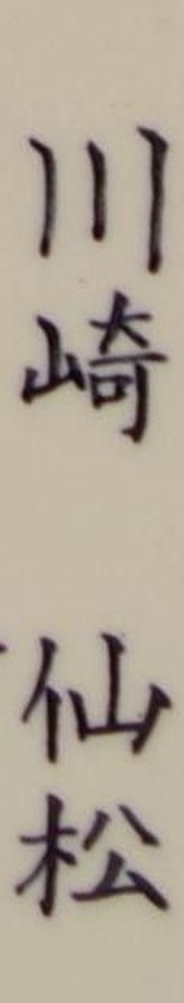川崎仙松
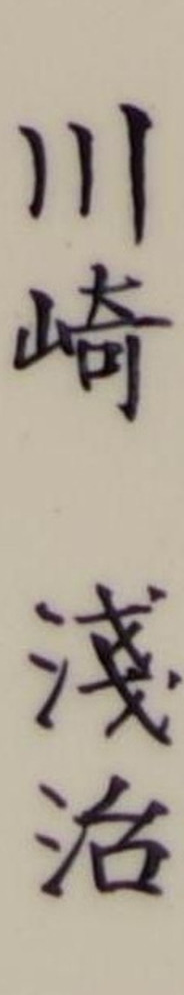川崎浅治
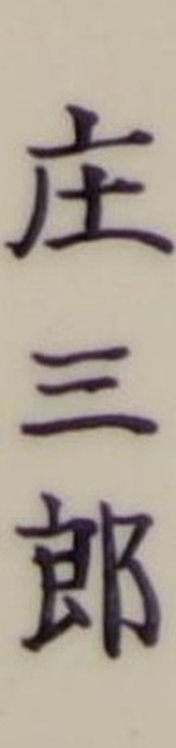庄三郎
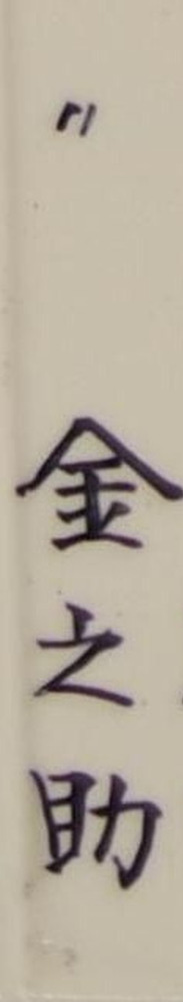金之助
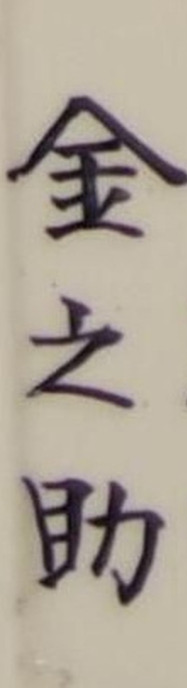金之助
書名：M~S
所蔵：高野山金剛峯寺
